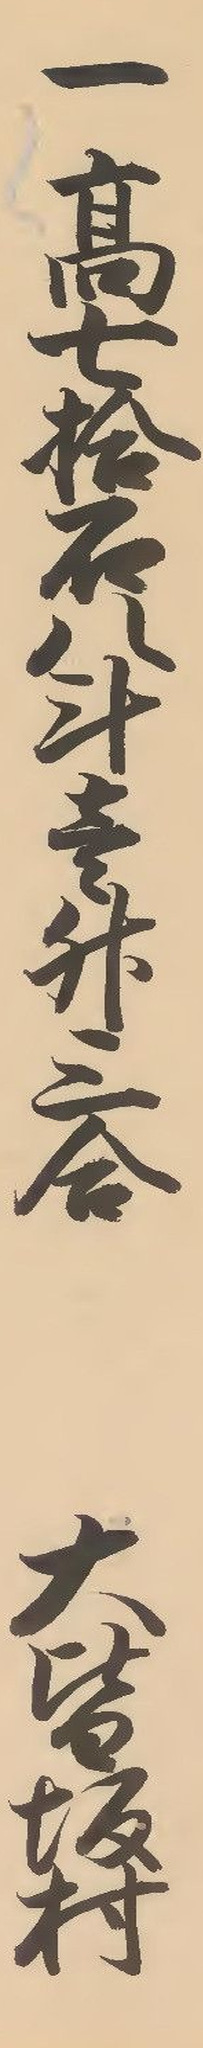一髙七拾石八斗壱升三合大皆坂村
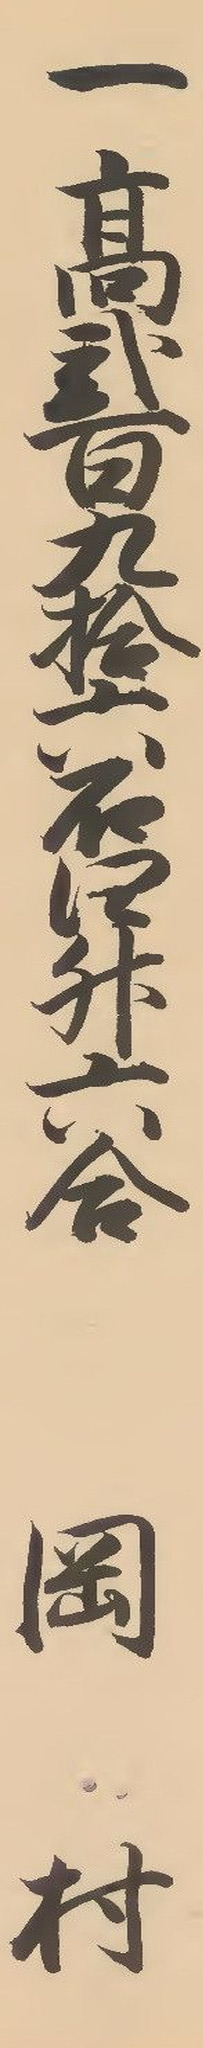一髙弐百九拾六石四升六合岡村
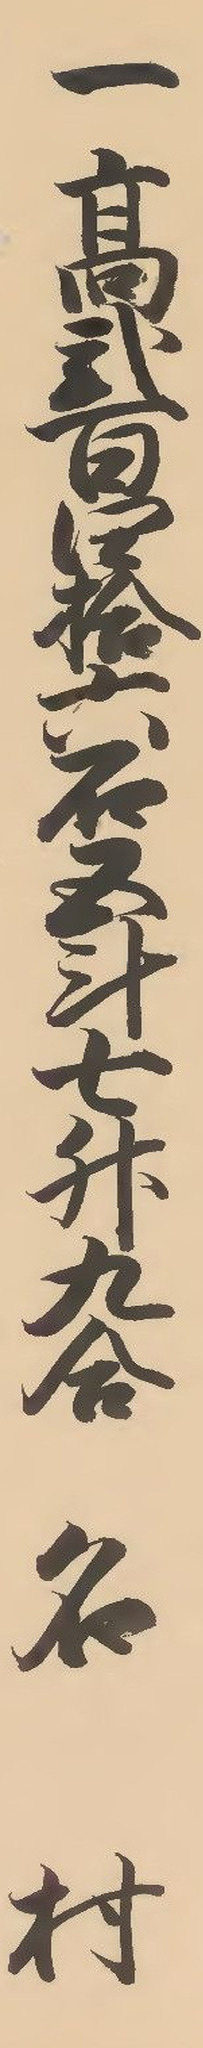一髙弐百四拾六石五斗七升九合名村
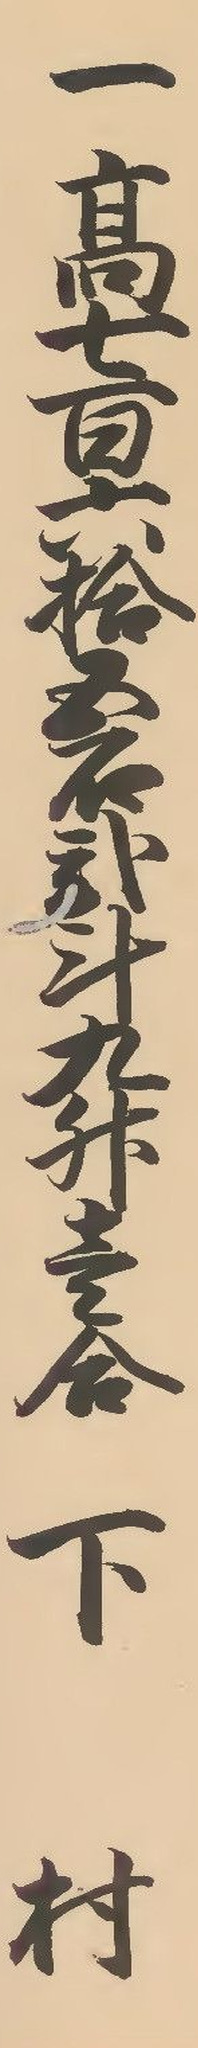一髙七百六拾五石弐斗九升壱合下村
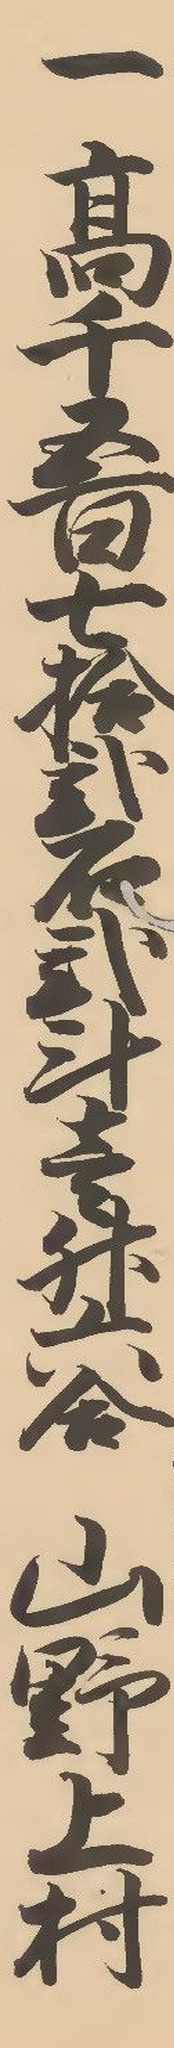一髙千五百七拾弐石弐斗壱升六合山野上村
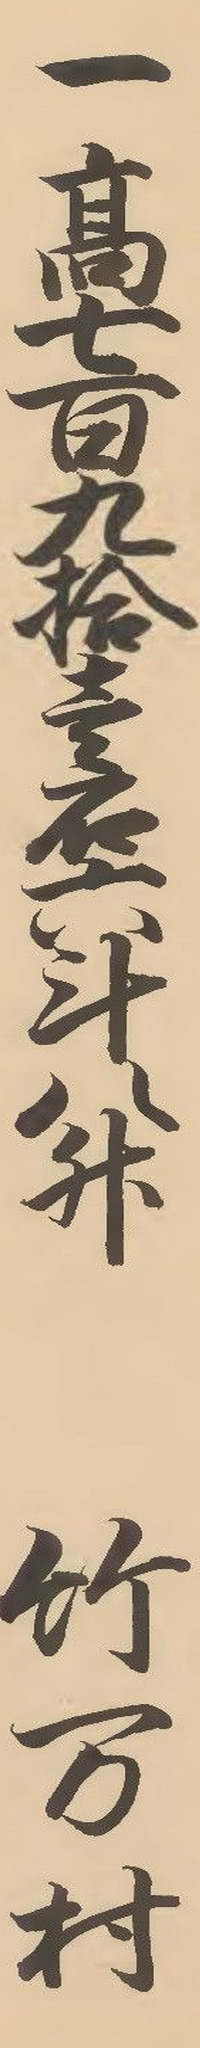一髙七百九拾壱石六斗八升竹万村
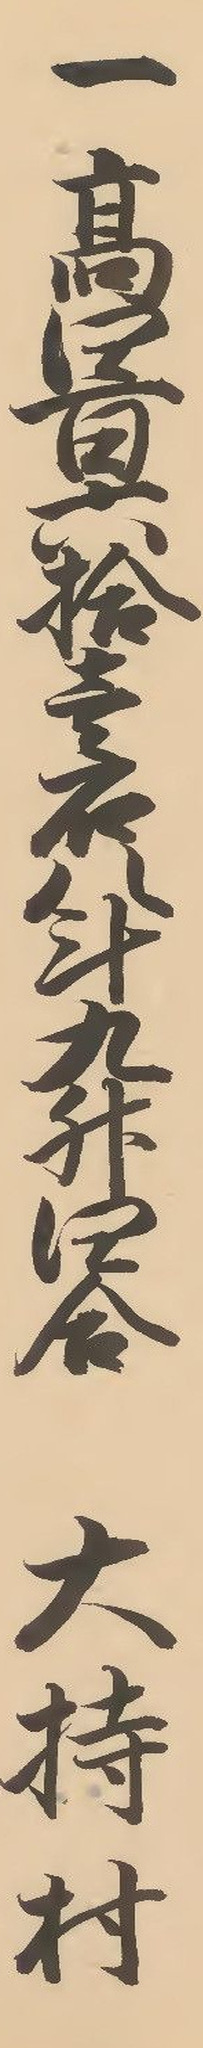一髙四百六拾壱石八斗九升四合大持村
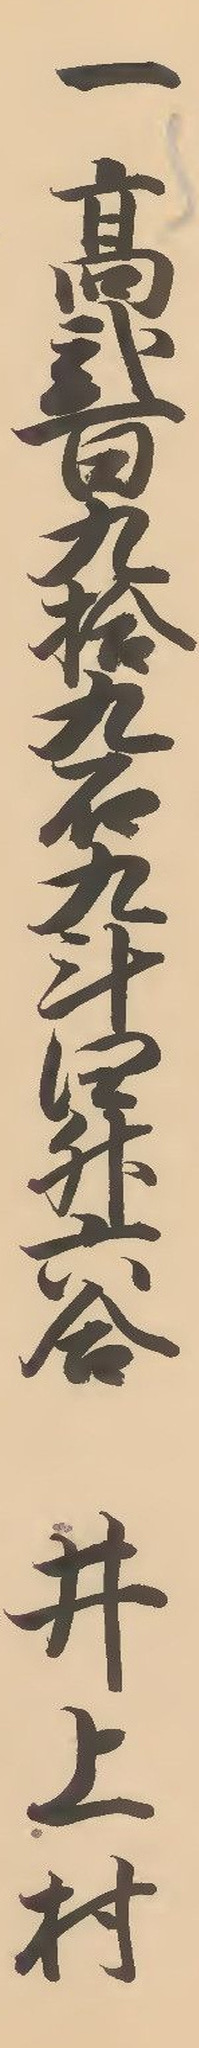一髙弐百九拾九石九斗四升六合井上村

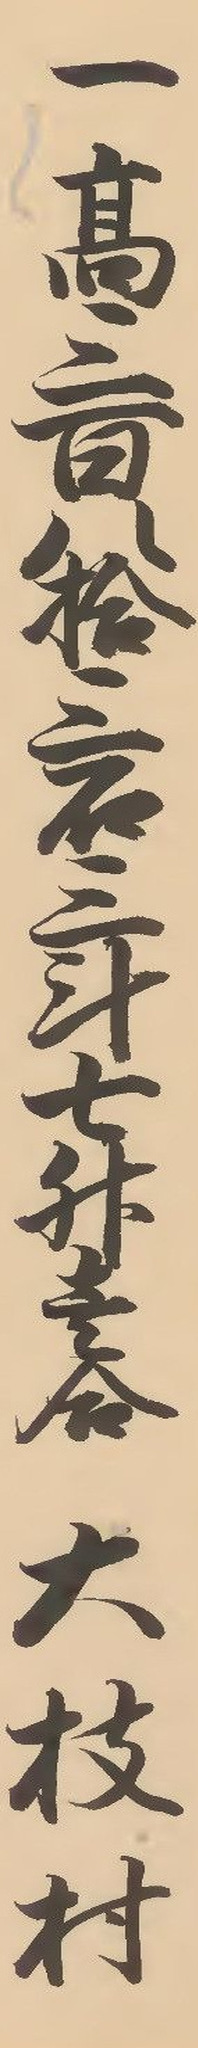一髙三百八拾三石三斗七升壱合大枝村
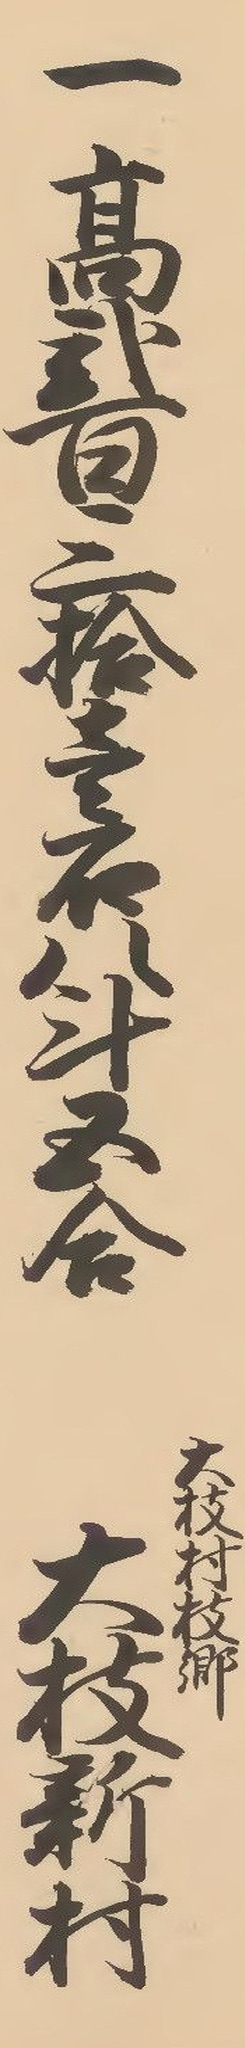一髙弐百三拾壱石八斗五合大枝新村
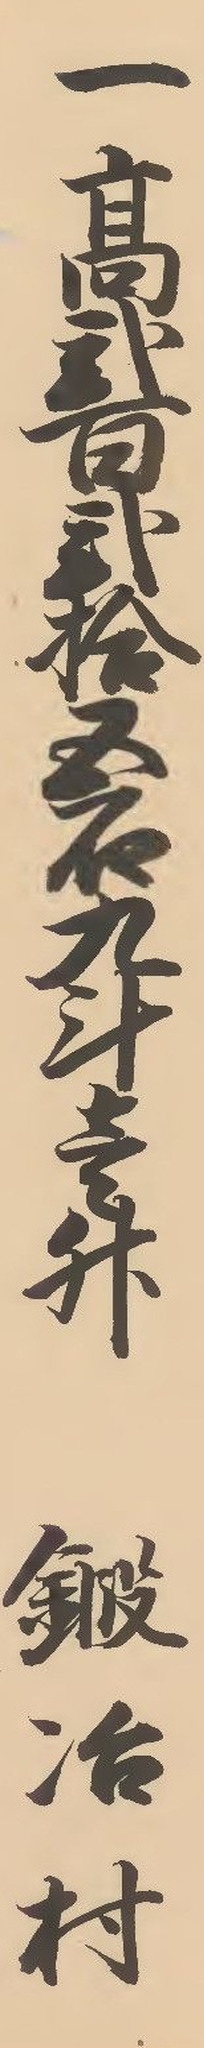一髙弐百弐拾五石九斗壱升鍛冶村
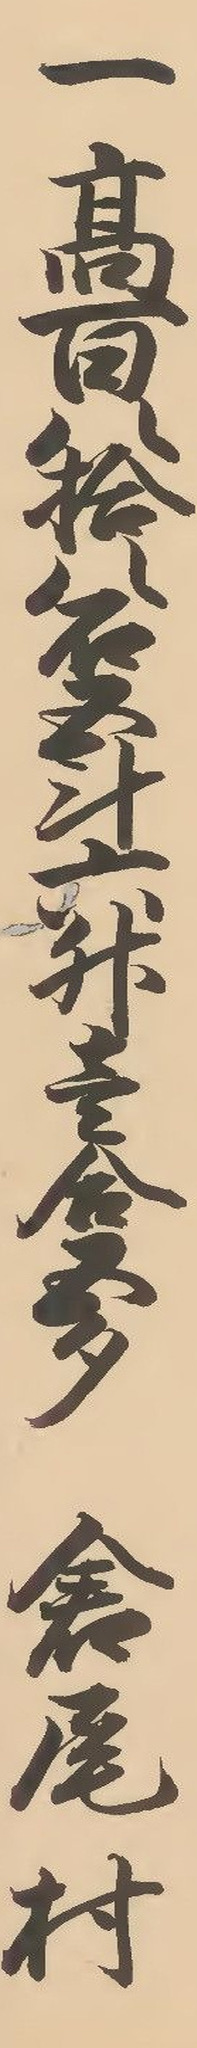一髙百八拾八石五斗六升壱合五夕倉尾村
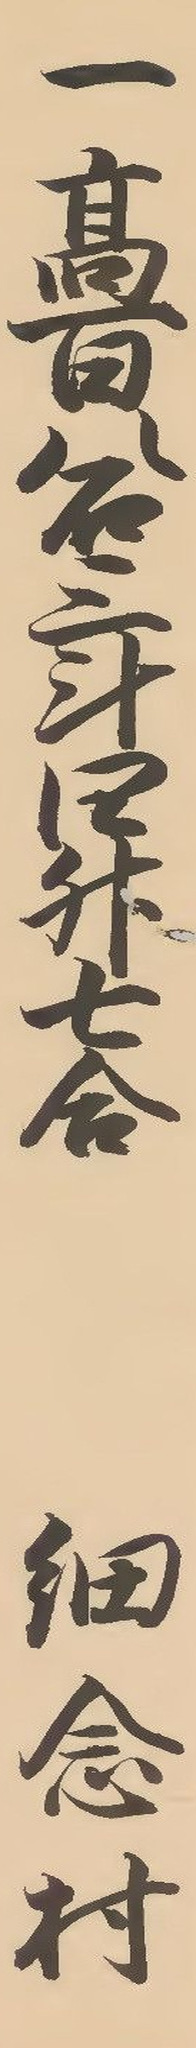一髙百八石三斗四升七合細念村
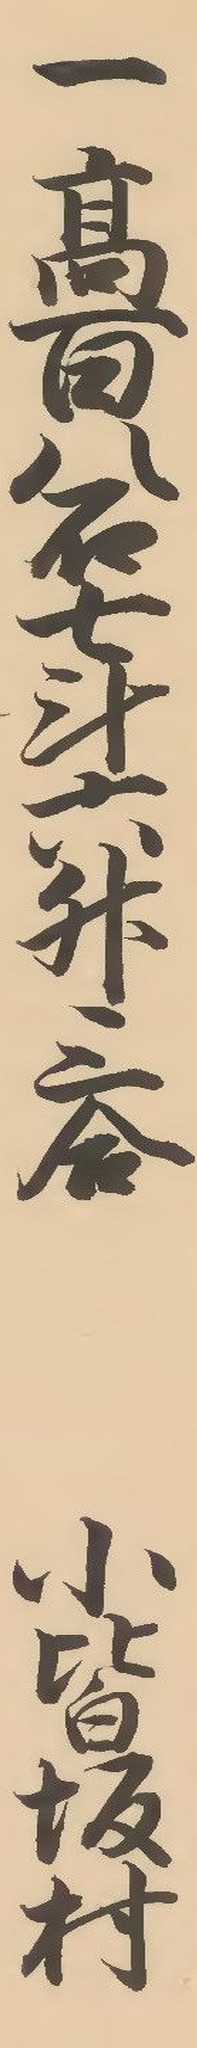一髙百八石七斗六升三合小皆坂村
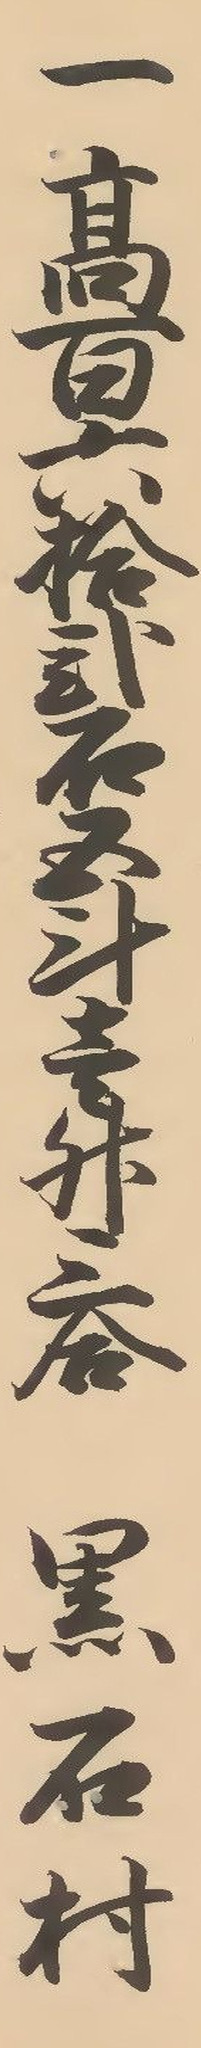一髙百六拾弐石五斗壱升三合黑石村
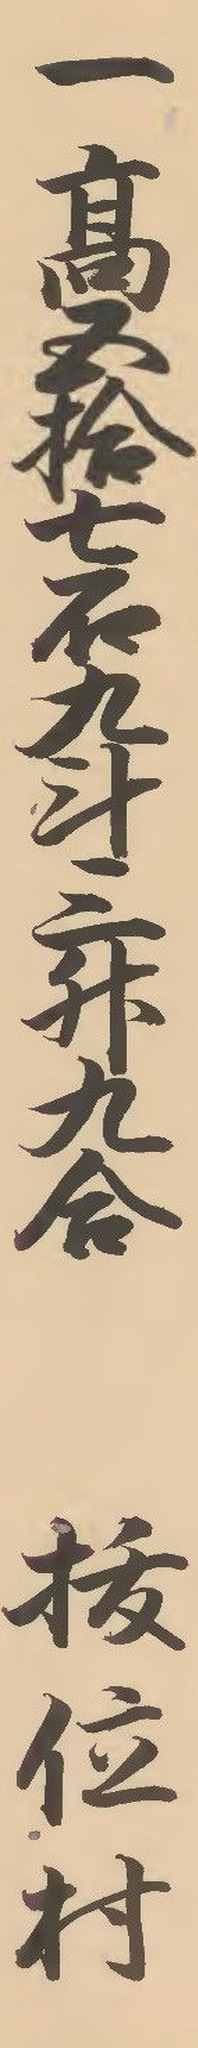一髙五拾七石九斗三升九合抜位村
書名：播磨国郷帳
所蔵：国立公文書館 National Archives of Japan
